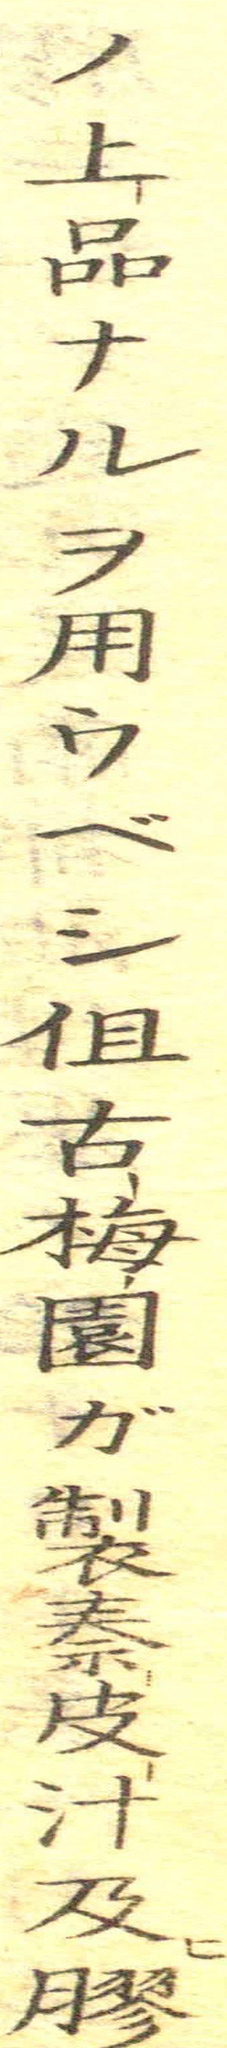ノ上品ナルヲ用ウベシ但古-梅-園ガ製秦-皮汁及膠
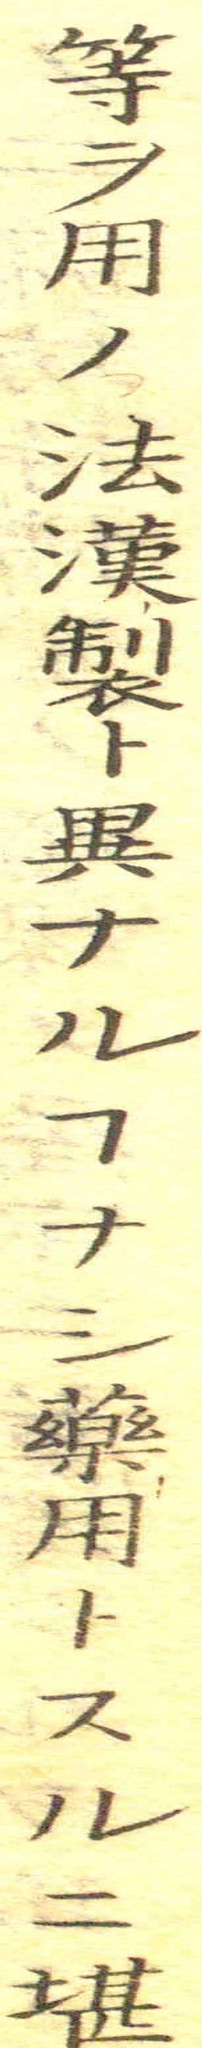等ヲ用ノ法漢-製ト異ナルコトナシ薬用トスルニ堪
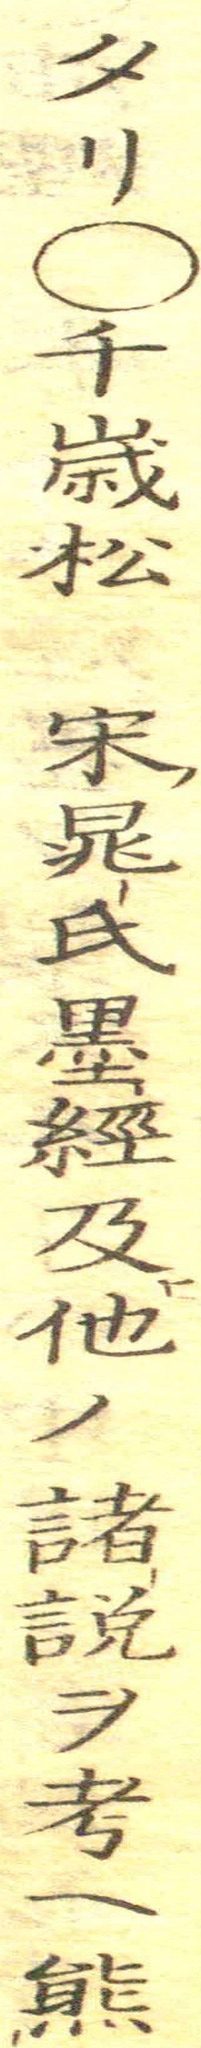タリ○千歳松宋晁-氏墨-経及他ノ諸-説ヲ考ヘ熊-
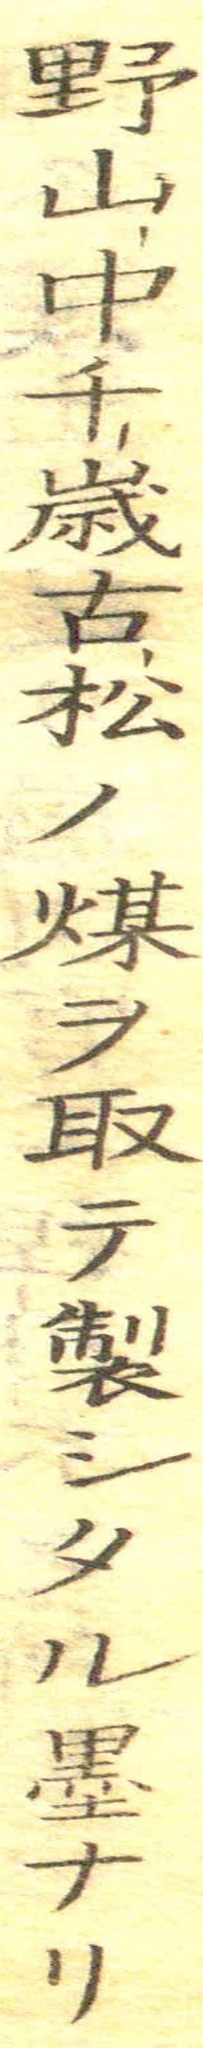野山-中-千-歳古-松ノ煤ヲ取テ製シタル墨ナリ
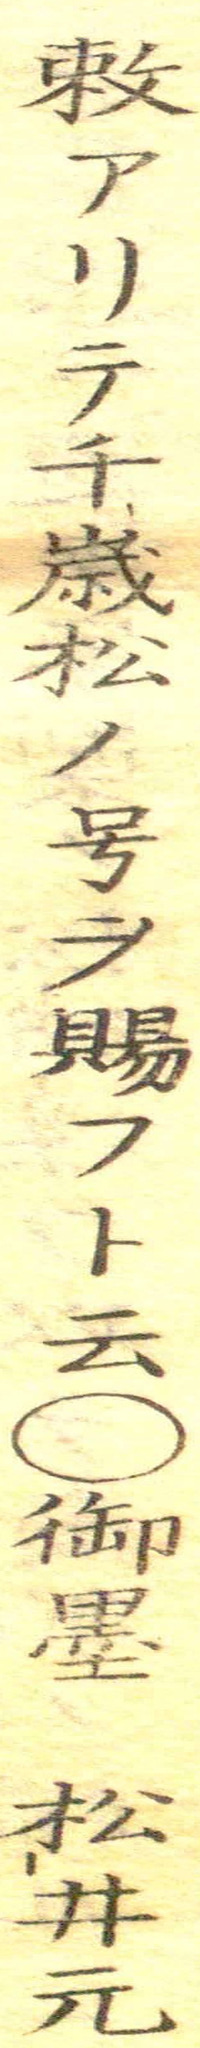勅アリテ千-歳松ノ号ヲ賜フト云○御墨松-井元

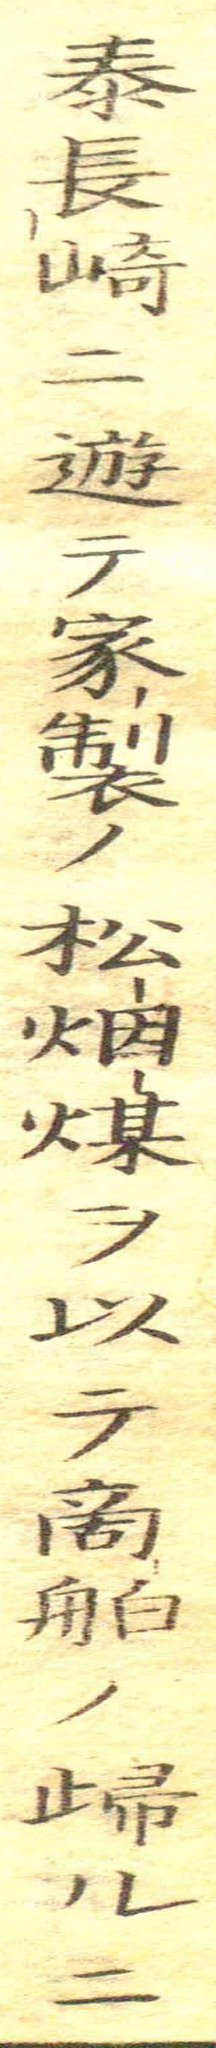泰長-崎ニ遊テ家-製ノ松-煙-煤ヲ以テ商舶ノ帰ルニ
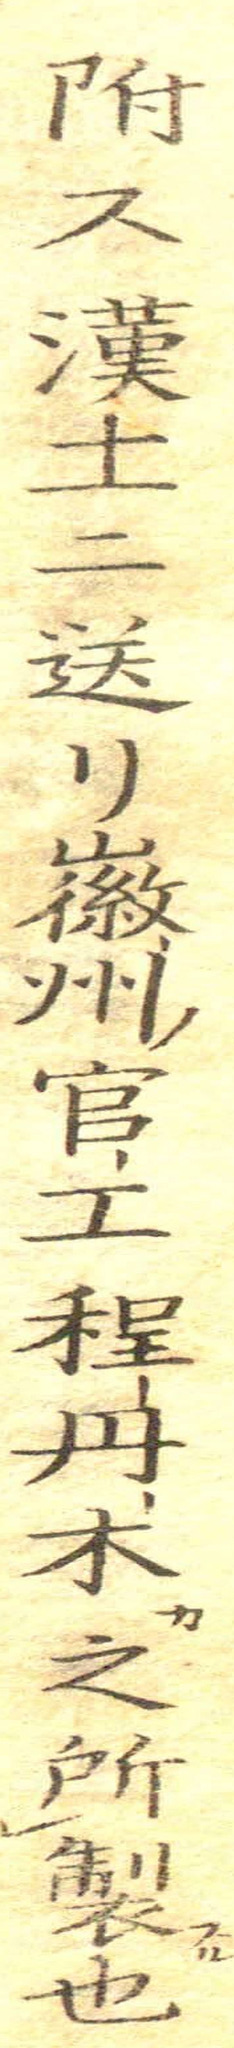附ス漢土ニ送リ徽州官-工程-丹-木之所製也
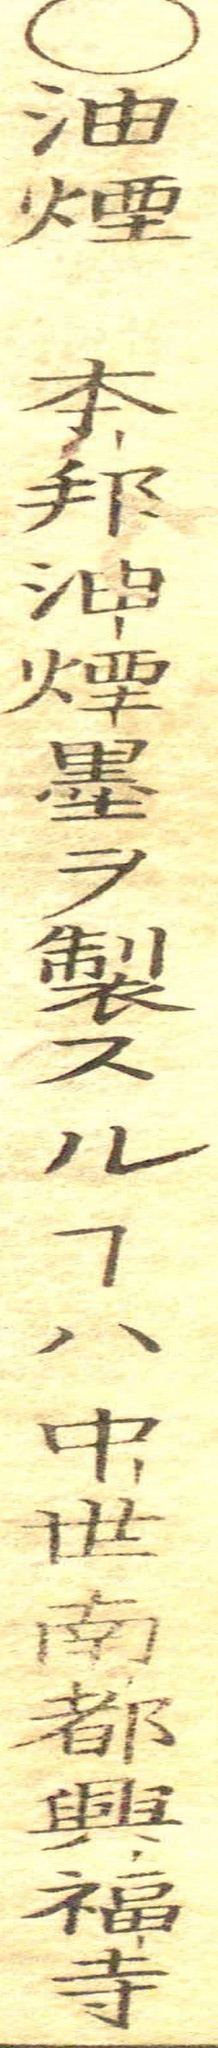○油煙本-邦油-煙墨ヲ製スルコトハ中-世南都興-福-寺
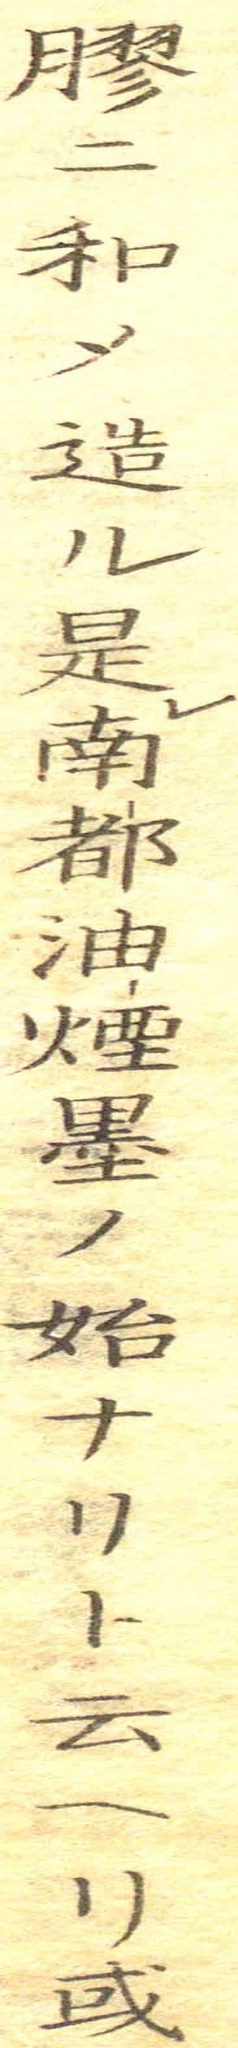膠ニ和シテ造ル是南-都油-煙墨ノ始ナリト云ヘリ或
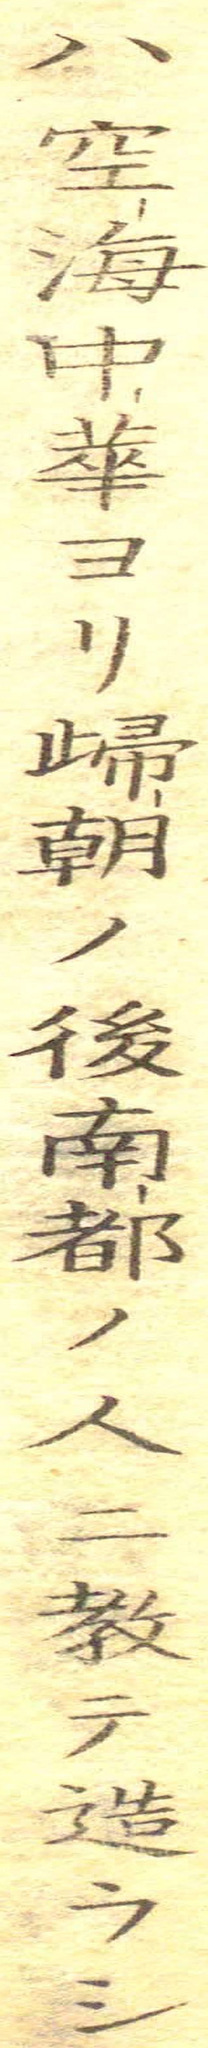ハ空-海中-華ヨリ帰-朝ノ後南-都ノ人ニ教テ造ラシ
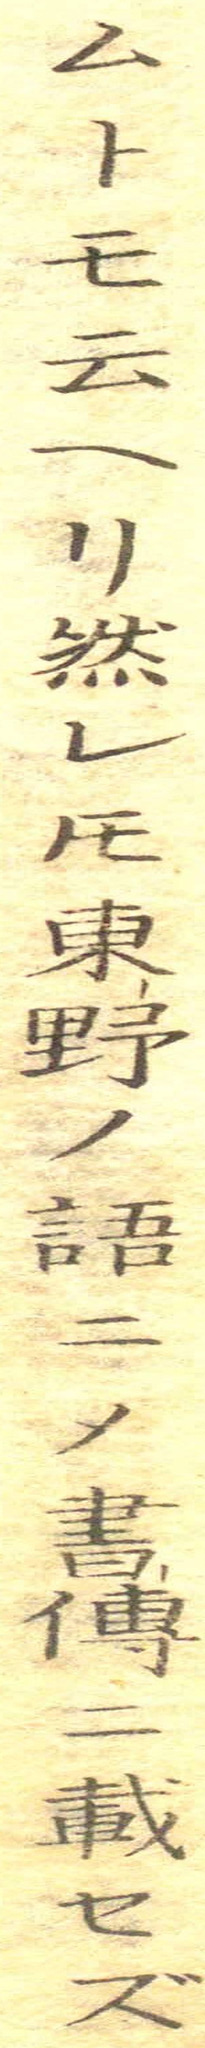ムトモ云ヘリ然レトモ東-野ノ語ニシテ書-伝ニ載セズ
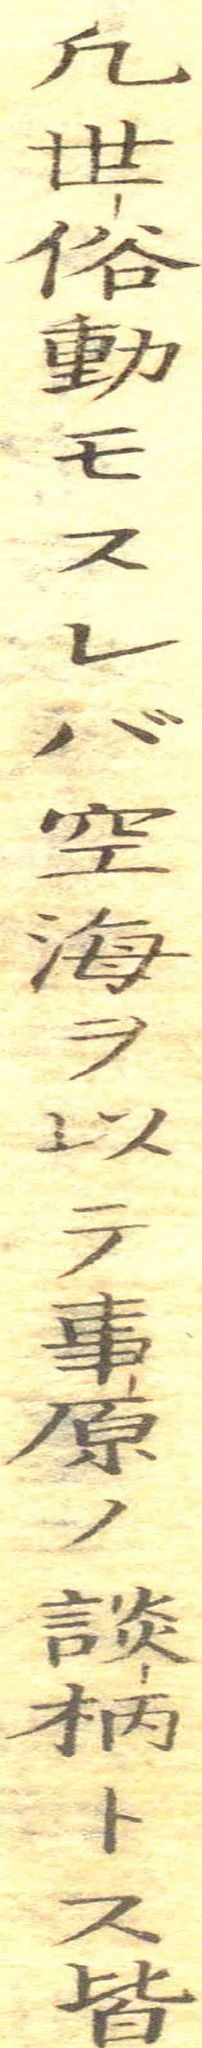凡世-俗動モスレバ空海ヲ以テ事-原ノ談-柄トス皆
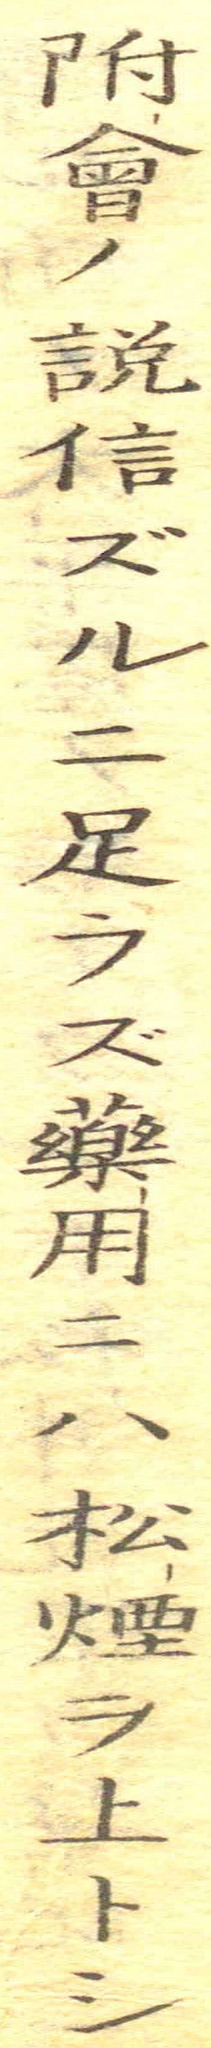附会ノ説信ズルニ足ラズ薬-用ニハ松-煙ヲ上トシ
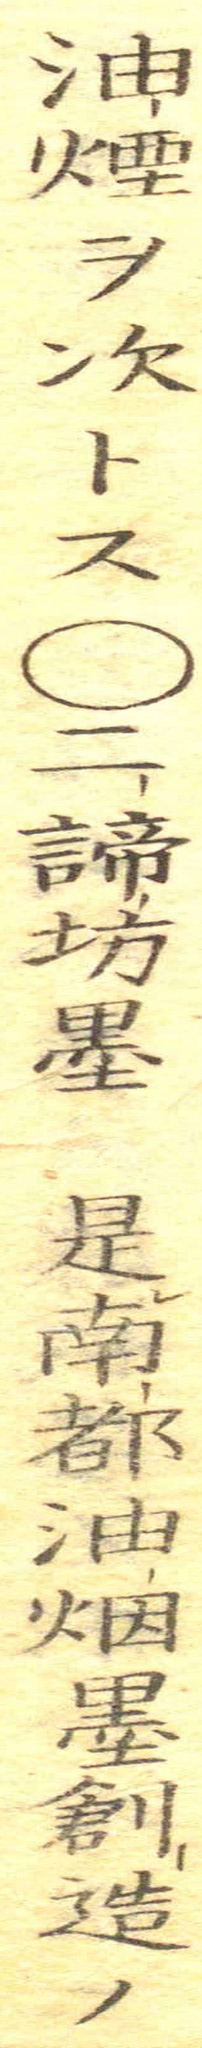油-煙ヲ次トス○二-諦-坊墨是南-都油-煙-煙墨創-造ノ
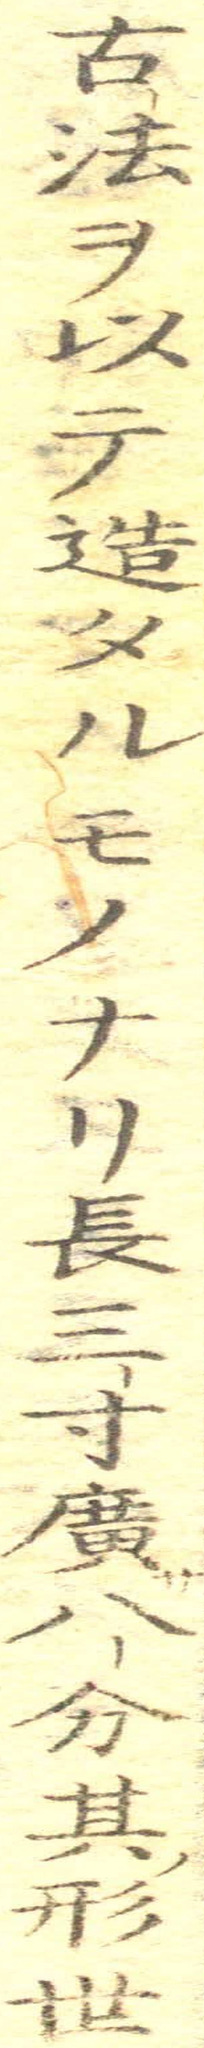古法ヲ以テ造タルモノナリ長三-寸広八-分其形世
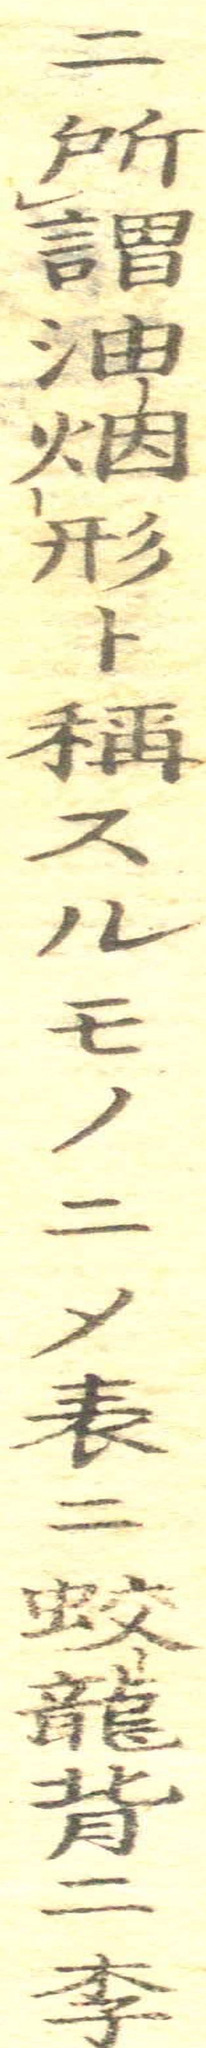ニ所謂油-煙-形ト称スルモノニシテ表ニ蚊-竜背ニ李
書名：物類品隲
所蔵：国文学研究資料館
